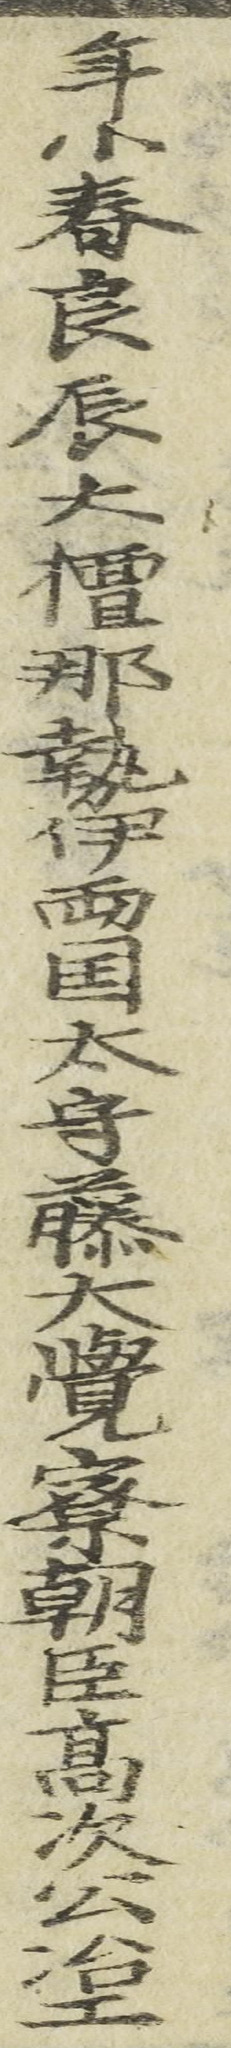年小春良辰大檀那勢伊両国太守藤大覚寮朝臣高次公治エ
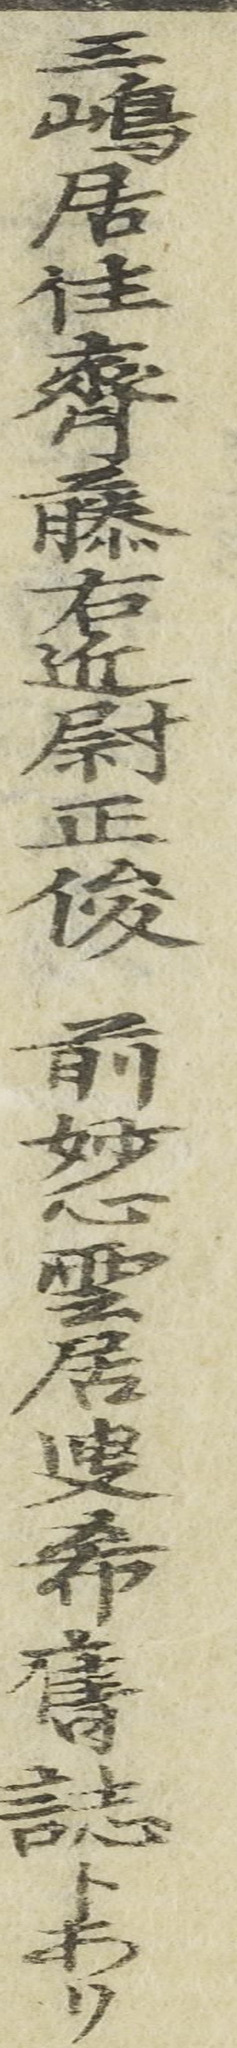三嶋居住齊藤右近尉正俊前妙心雲居叟希膺誌とあり
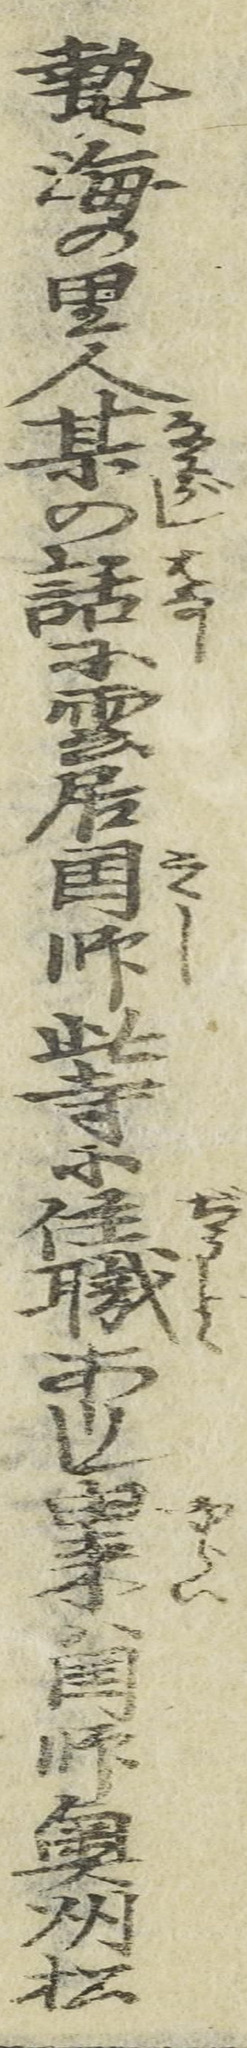熱海の里人某の話に雲居国師此寺に住職ありし由来は国師奥州松
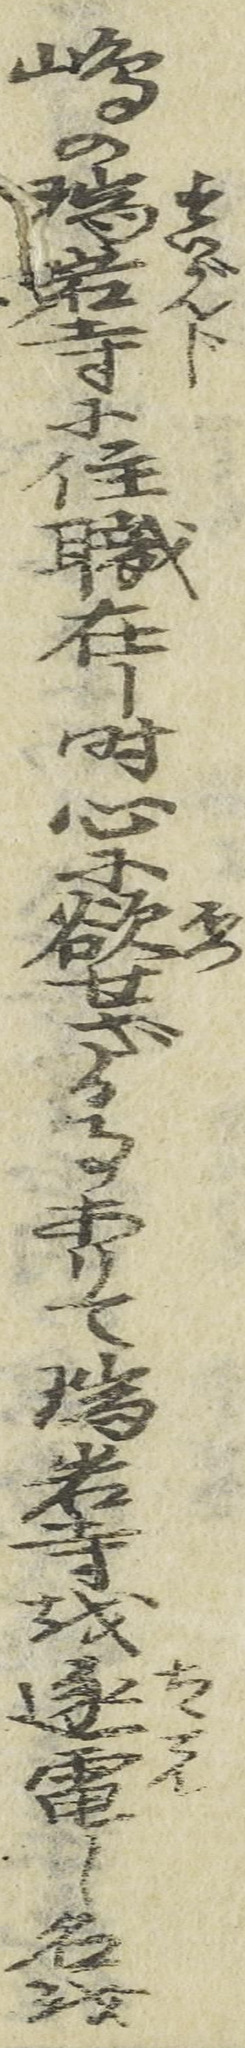嶋の瑞岩寺に住職在し時心に欲せざる事ありて瑞岩寺を逐電し名を
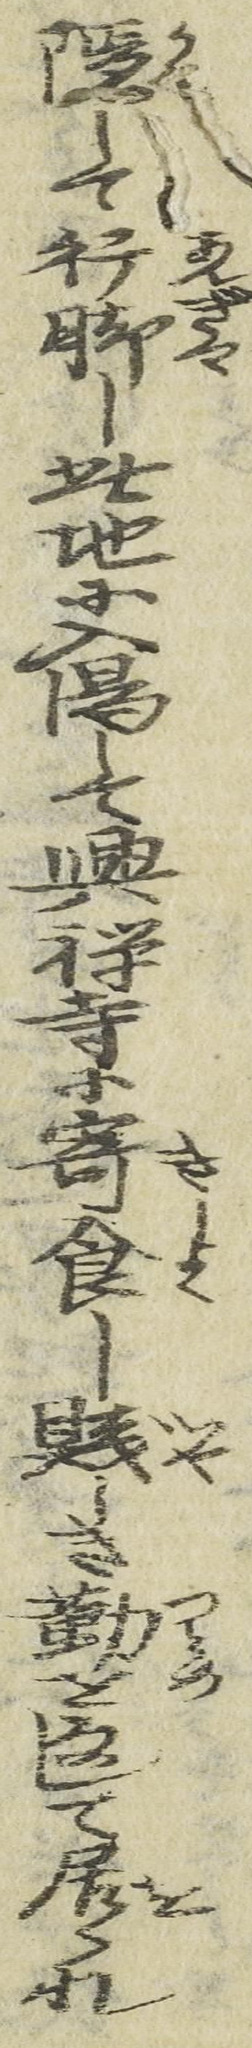隠して行脚し此地に入湯して興禅寺に寄食し賎しき勤をなして居られ
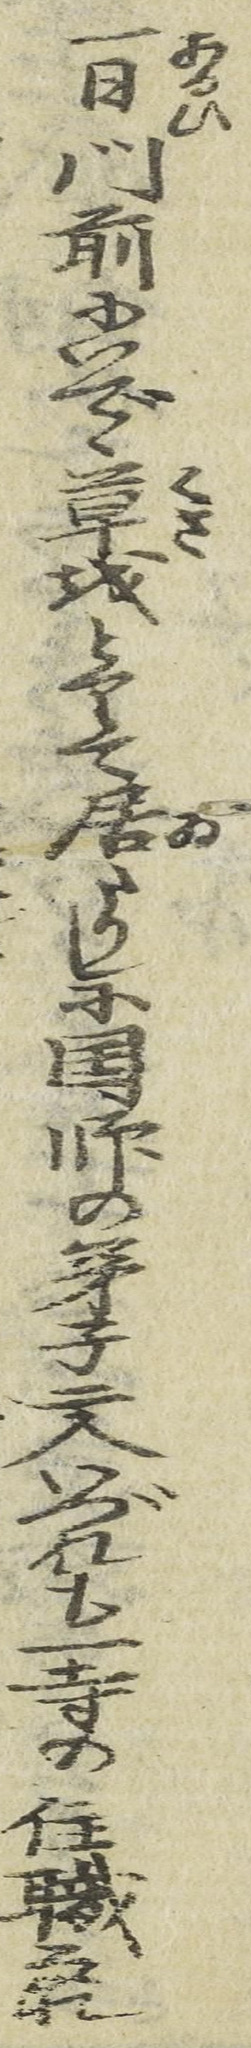一日門前にいでゝ草をとりて居たりしに国師の弟子二人いづれも一寺の住職なれ
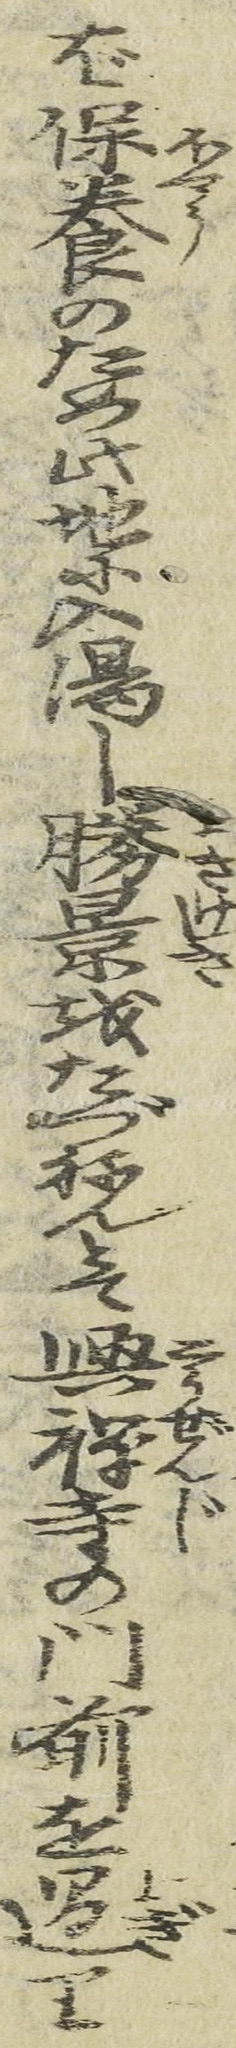ば保養のため此地に入湯し勝景をたづねんとて興禅寺の門前を過り
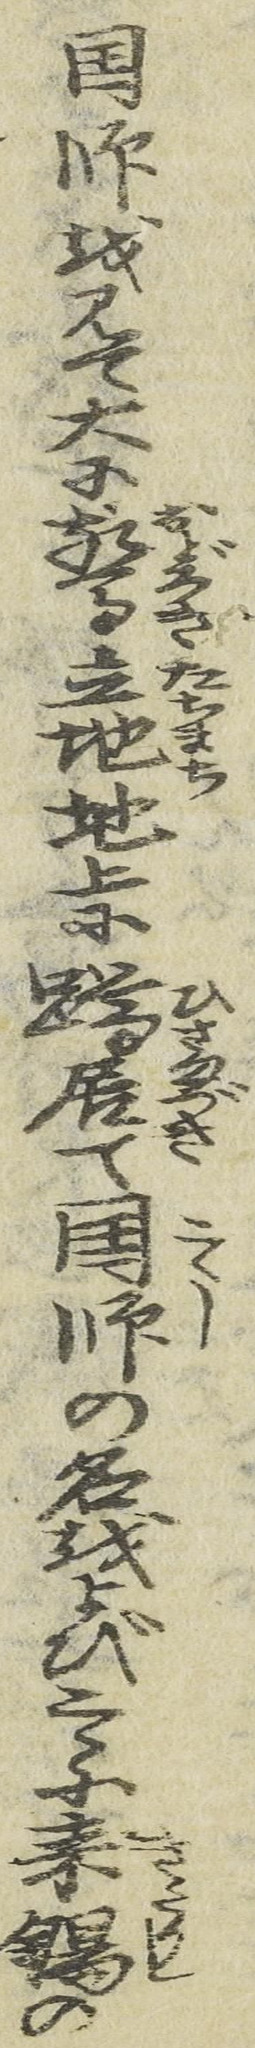国師を見て大に驚立地地上に跪居て国師の名をよびこゝに来錫の
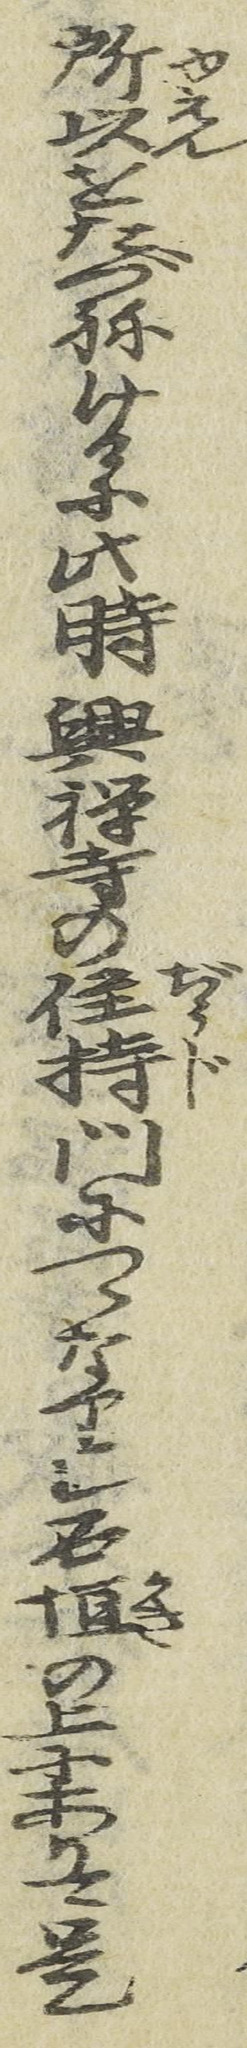所以をたづねけるに此時興禅寺の住持門につらなりし石垣の上にありて是
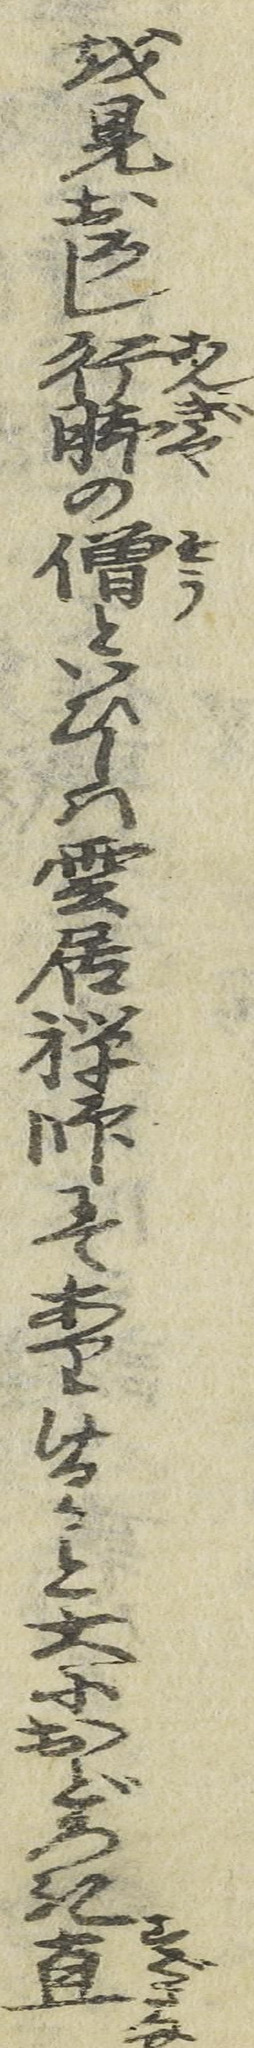を見おろし行脚の僧といひしは雲居禅師にてありけると大におどろき直

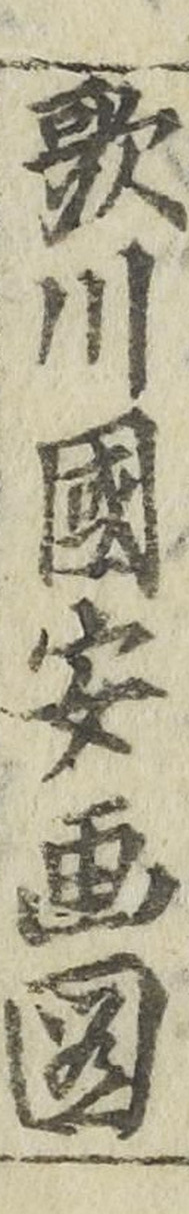歌川国安画図

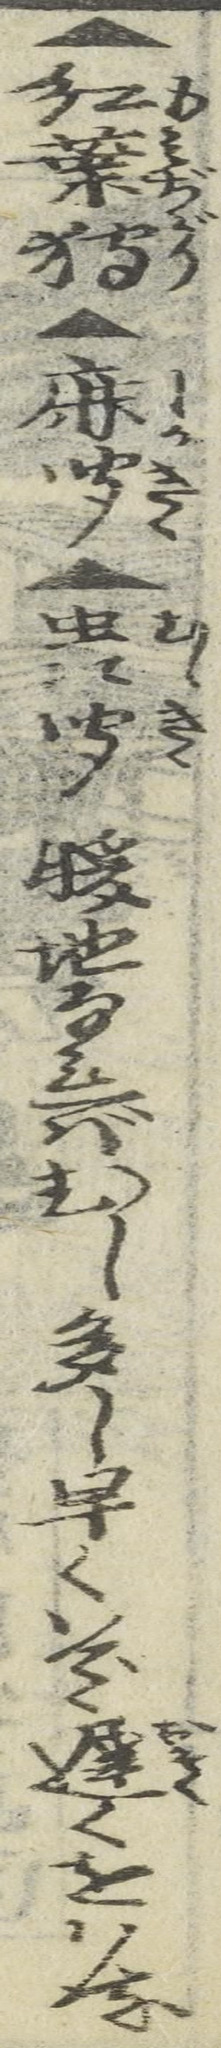▲紅葉狩▲鹿聞▲蟲聞暖地なればむし多し早くいでゝ遅くをはる
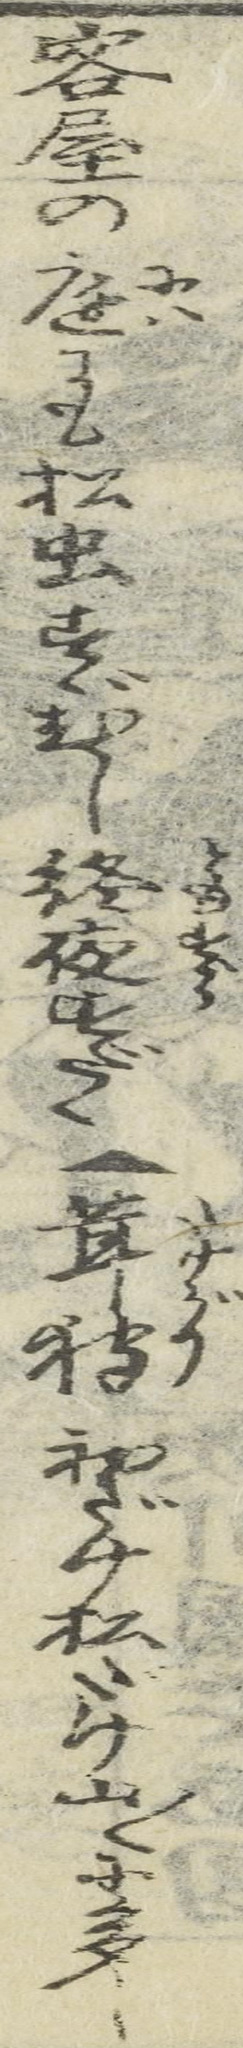客屋の庭にも松虫すゞむし終夜すだく▲茸狩初だけ松だけ山〱に多し
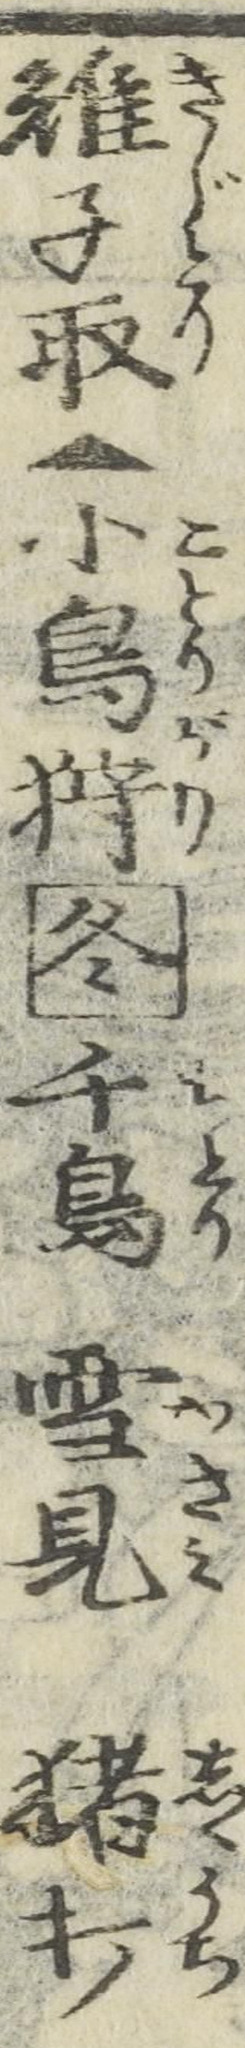雉子取▲小鳥狩冬千鳥雪見猪打
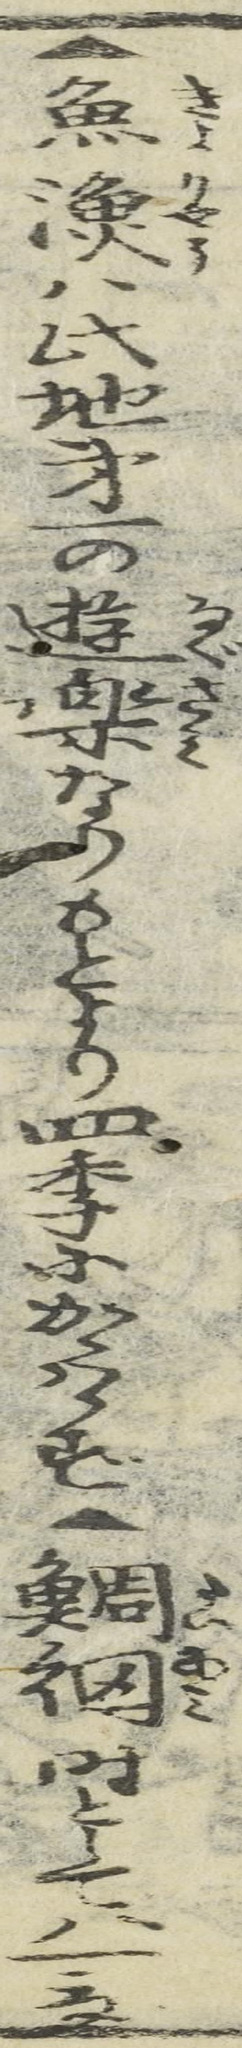▲魚漁は此地第一の遊楽なりもとより四季にかゝはらず▲鯛網時としては一度
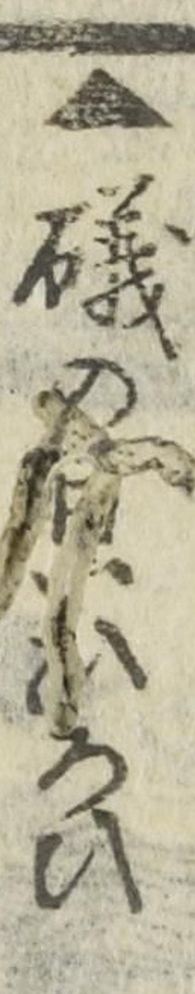▲磯の貝ひろひ
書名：熱海温泉圖彙
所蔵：東京大学地震研究所図書室 Earthquake Research Institute Library, The University of Tokyo, JAPAN
